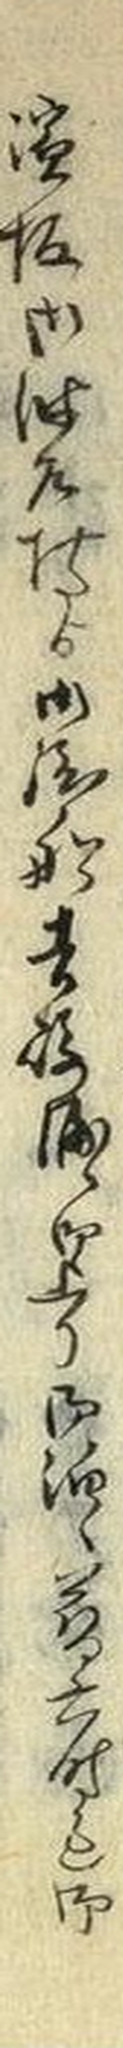浜坂御波戸場ゟ御渡船吉崎浦へ御上り御泊へ暮六時過御
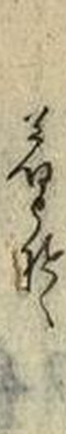着被遊候
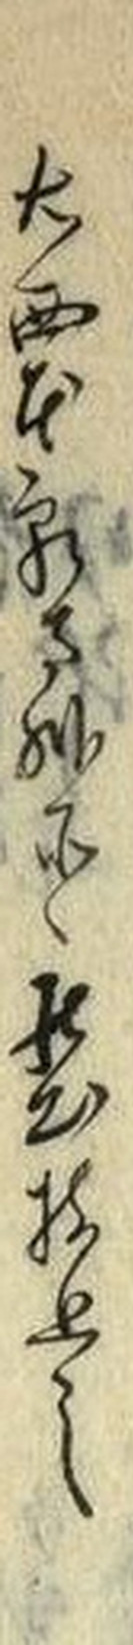右西本願寺掛所へ罷出指上之
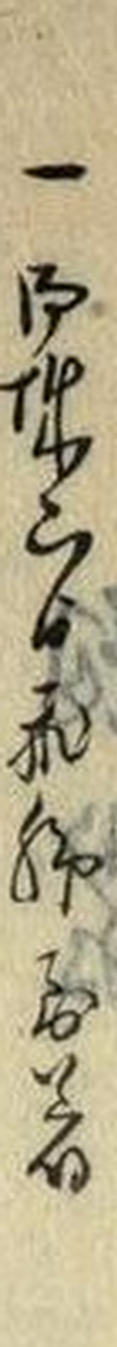一御城下ゟ飛脚到着

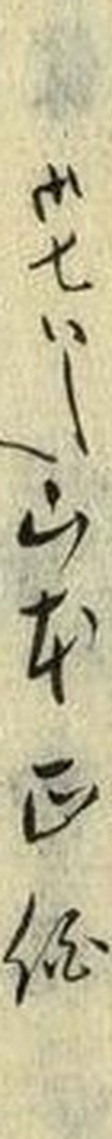煮付肴御匙いし山本正伯
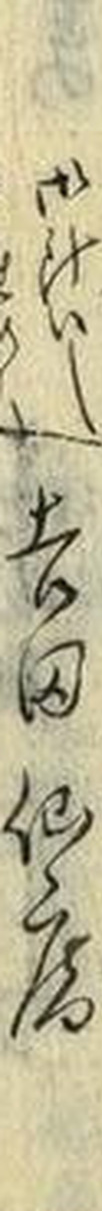御針いし吉田仙庵
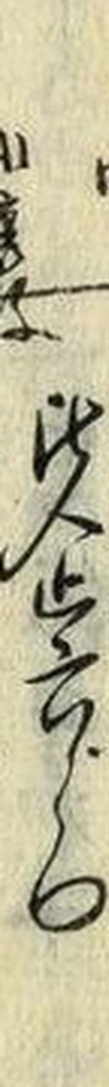同比企六郎右衛門
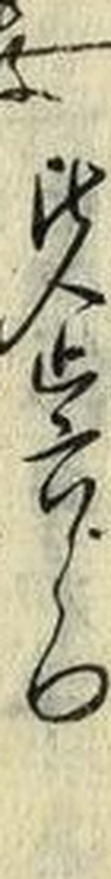同比企六郎右衛門

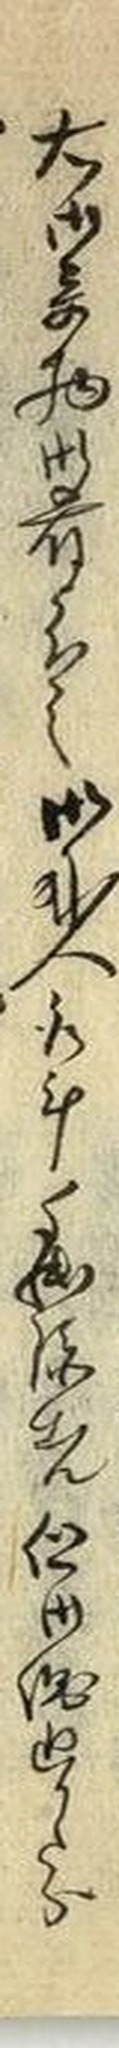右御寄物御肴被下之御用人取計手紙添出ル但御側廻り之分
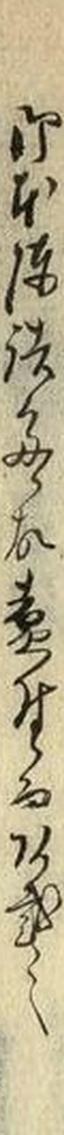御本陣詰多候故煮付ニ而頂戴之
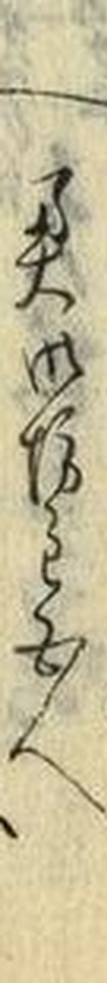奥御坊主五人
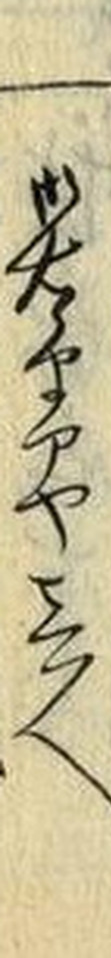御右筆部や壱人
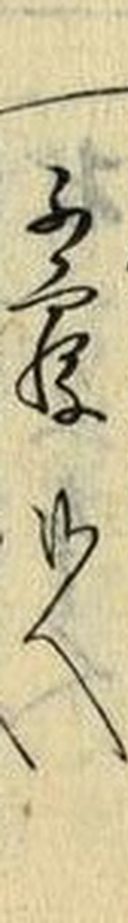不寝弐人
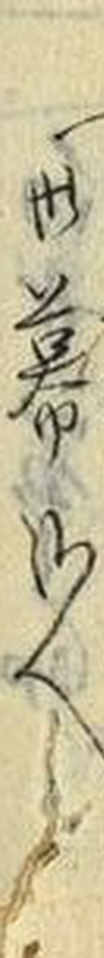御幕弐人
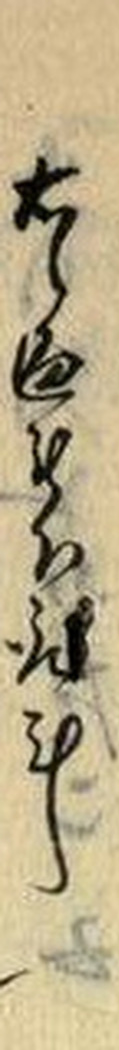右之通被下取計
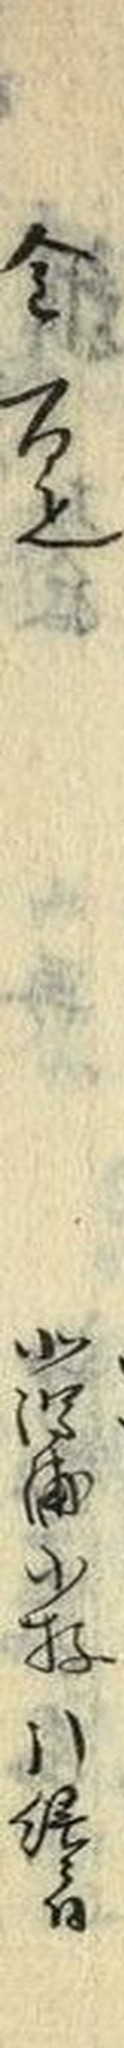金百疋北潟浦小牧引網ニ付
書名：少傅日録抄（斉承付側向頭取日記、在国）
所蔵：福井県文書館 Fukui Prefectural Archives
